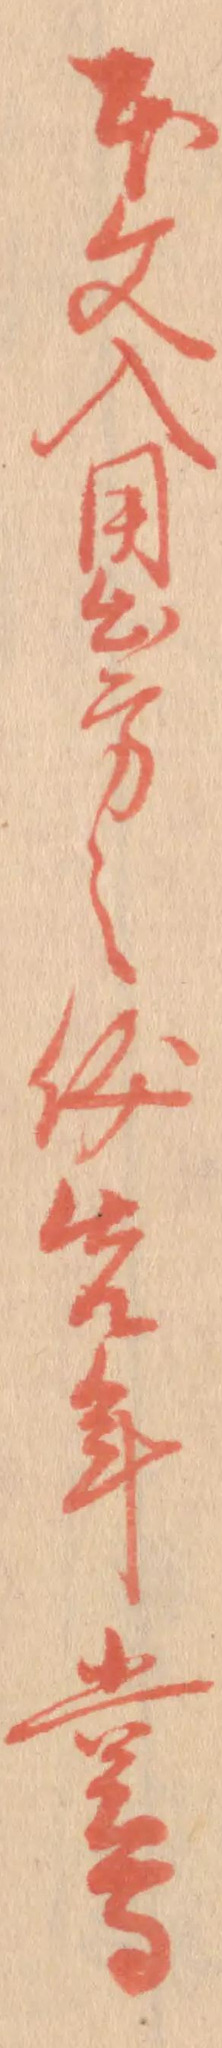本文入用出方之儀先年堂守
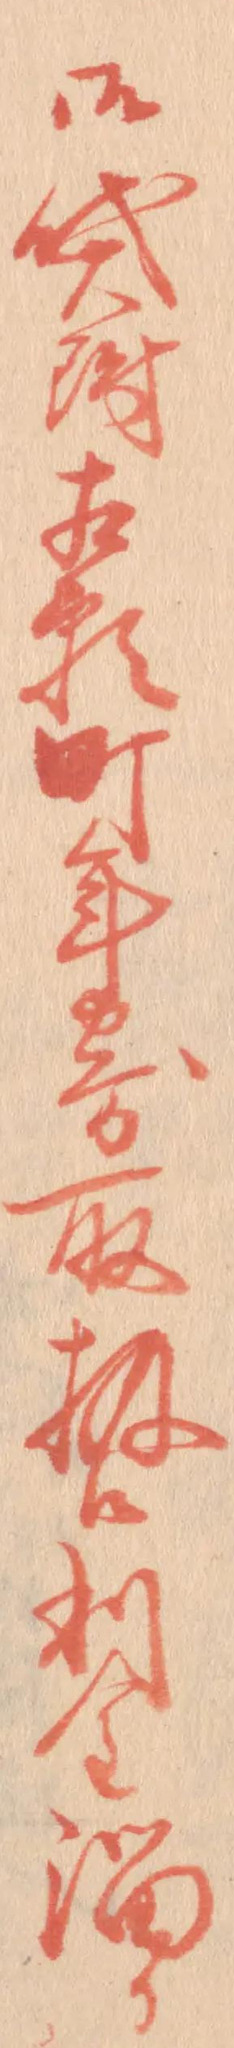御貸付相頼町年寄取扱候利金溜り
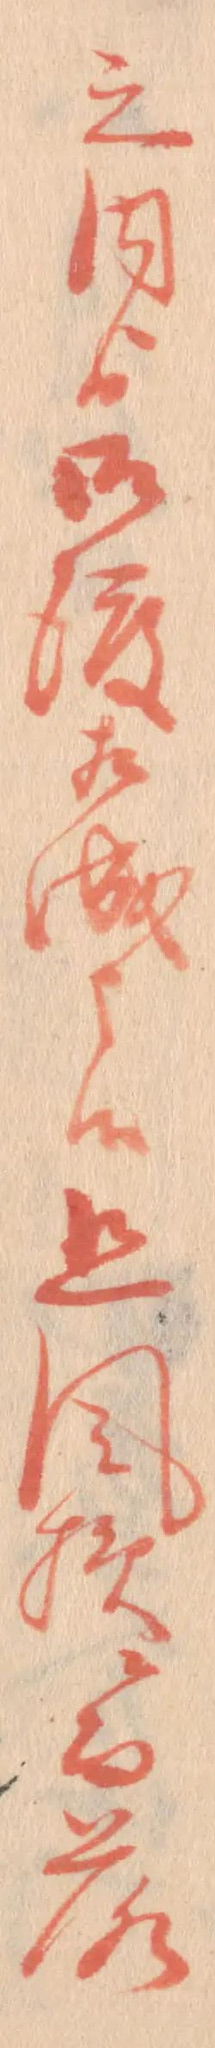之内ゟ御渡相成申候且風損に而落
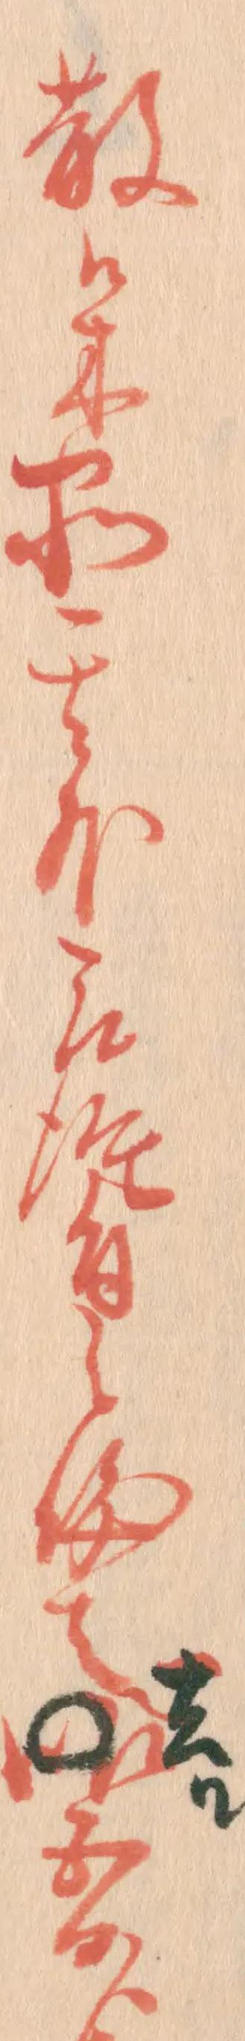散候木品其外取片付之儀は去る五日ゟ
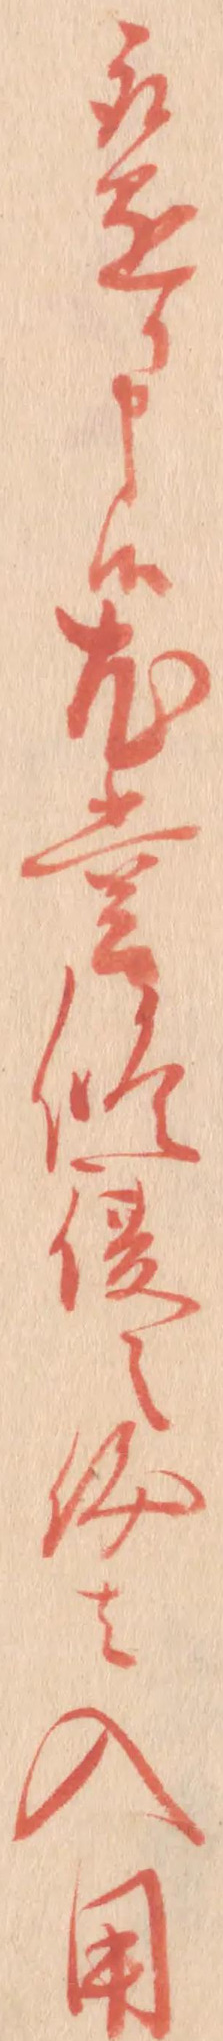取懸り申候尤堂修復之儀は入用
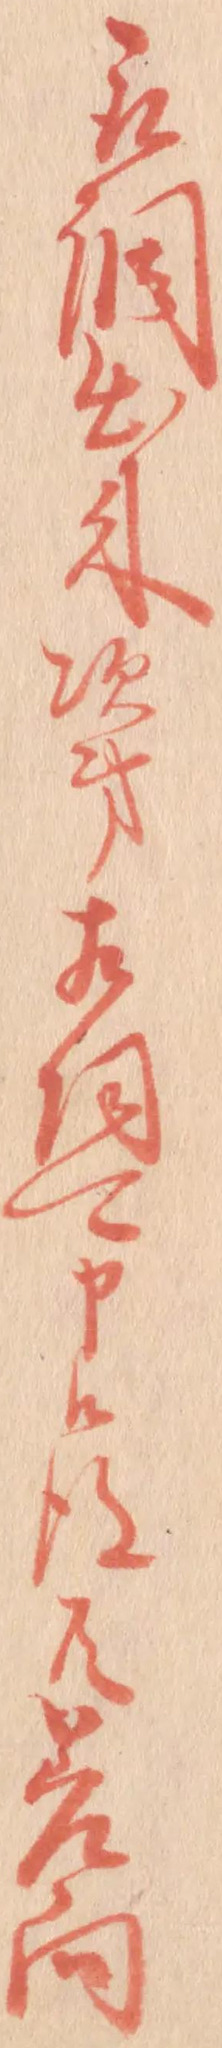取調出来次第相伺可申候得共差向

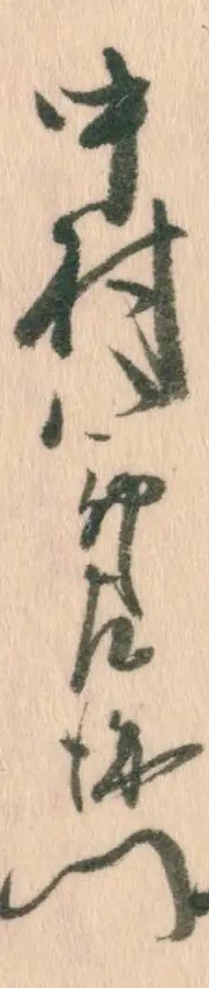中村八郎左衛門
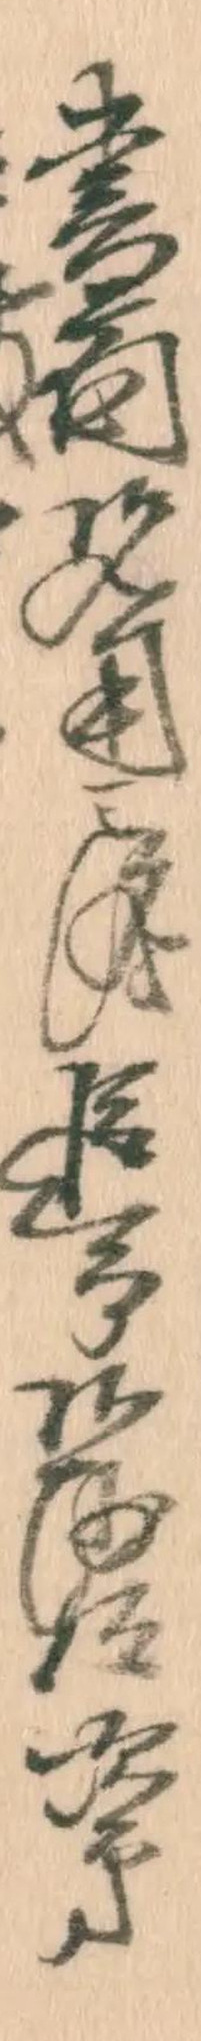書面御入用之儀追而御沙汰次第
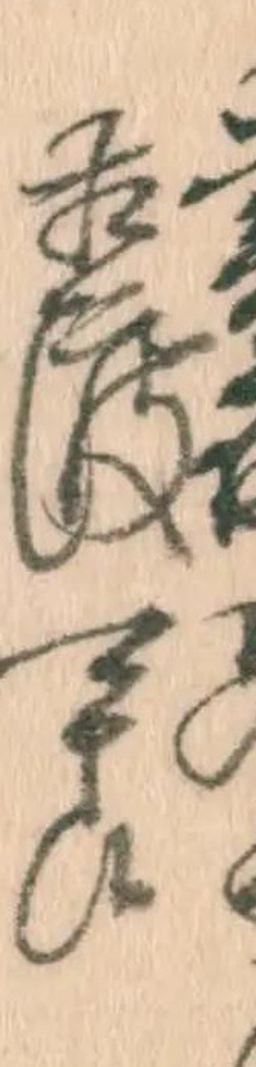相渡可申候
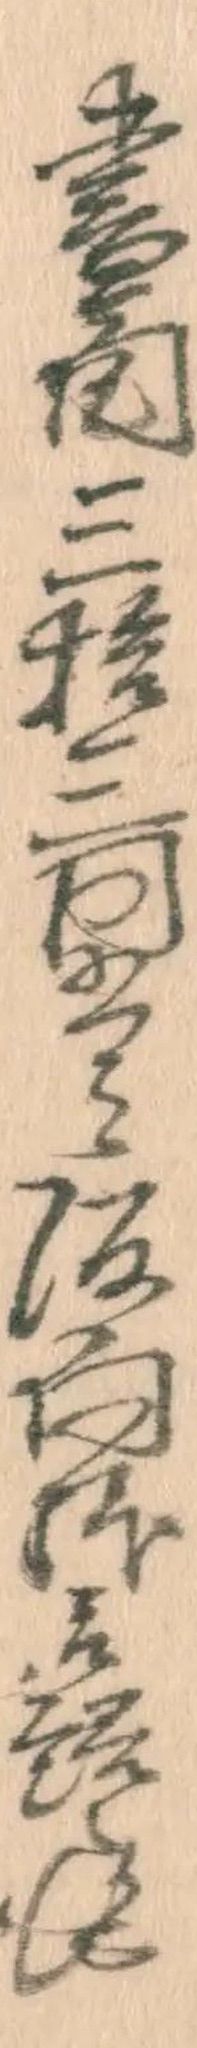書面三拾三間堂仮向拝差繕之儀
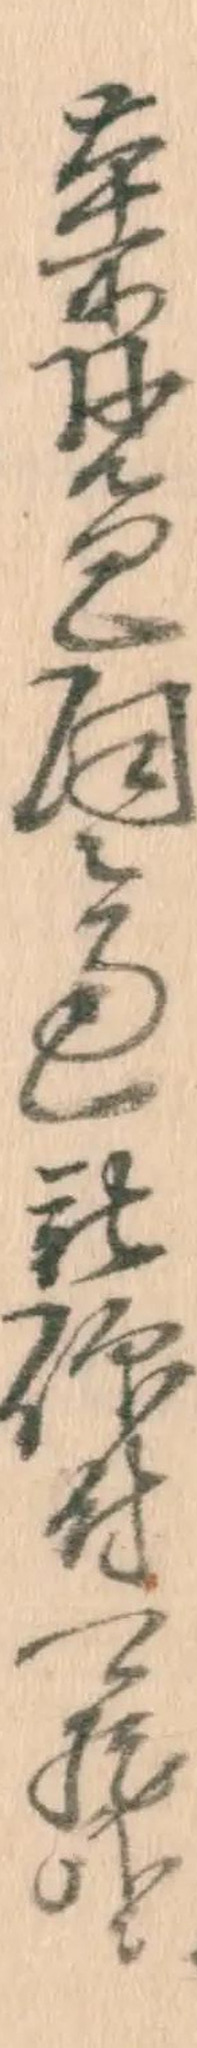本所見廻伺之通被仰付可然哉に
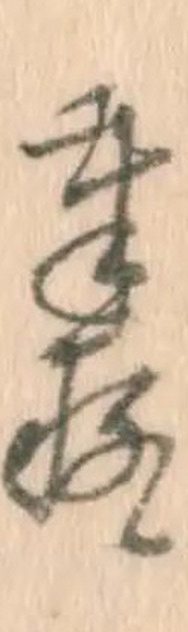奉存候

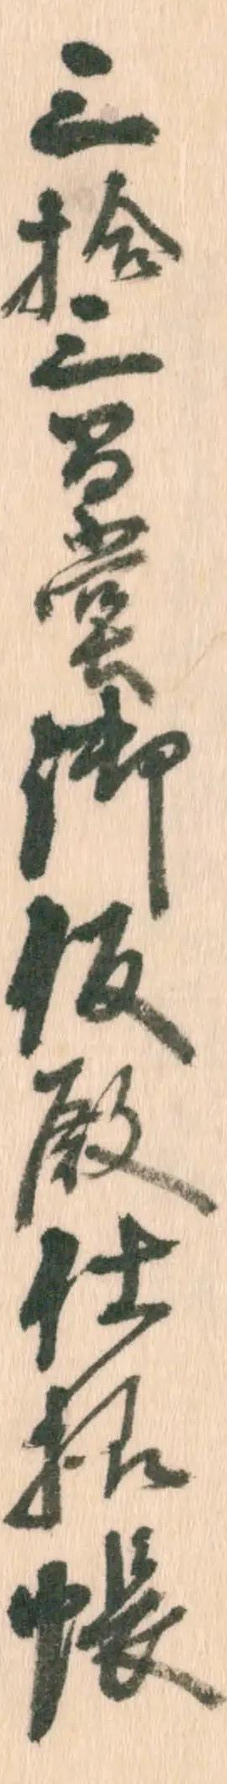三拾三間堂御仮殿仕様帳

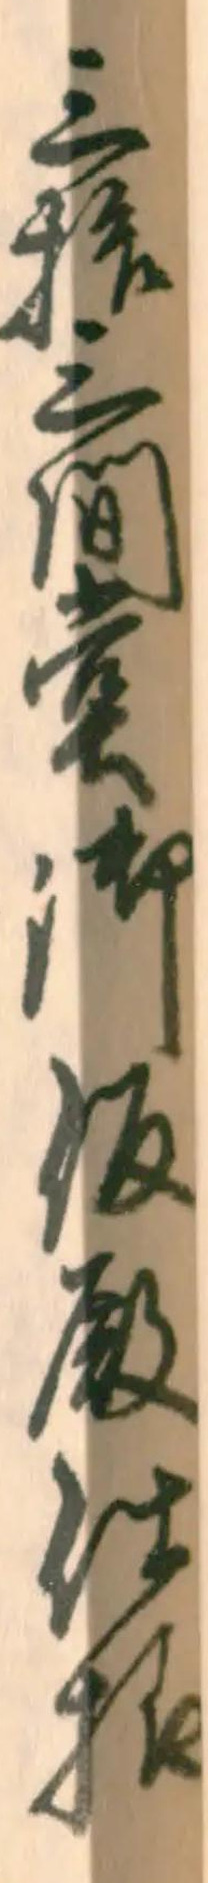三十三間堂御仮殿仕様
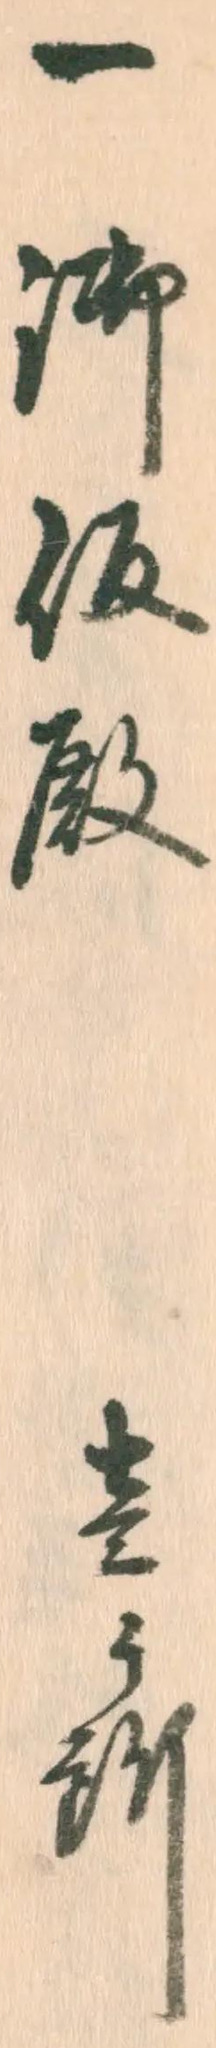一御仮殿壱ヶ所
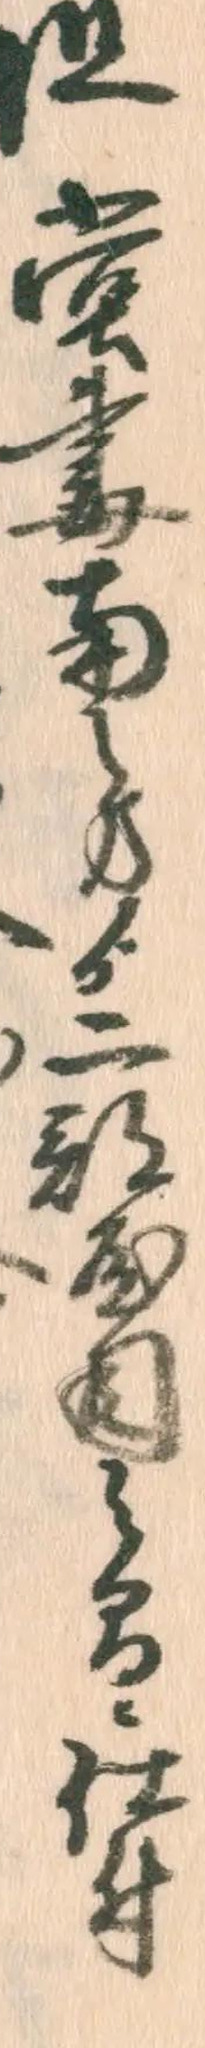但堂書南之方ゟ二部屋目之間に仕付
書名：三十三間堂. [1]
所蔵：国立国会図書館 National Diet Library, JAPAN
